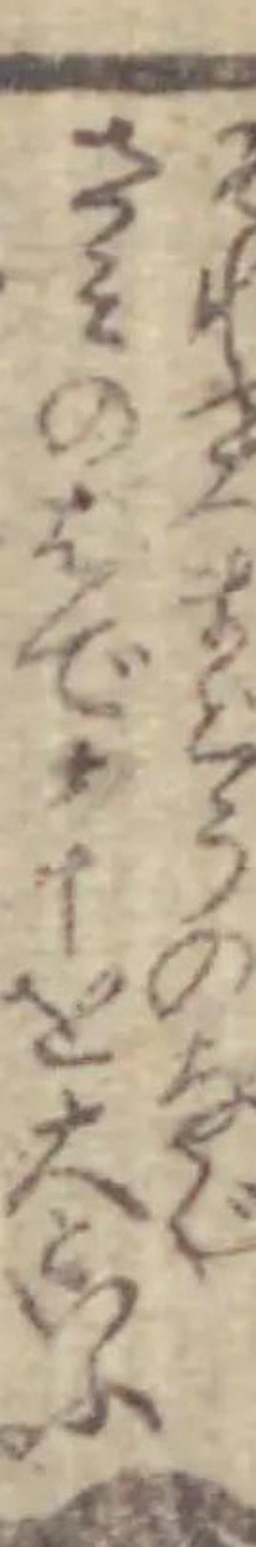さみのはで五十を大といふ
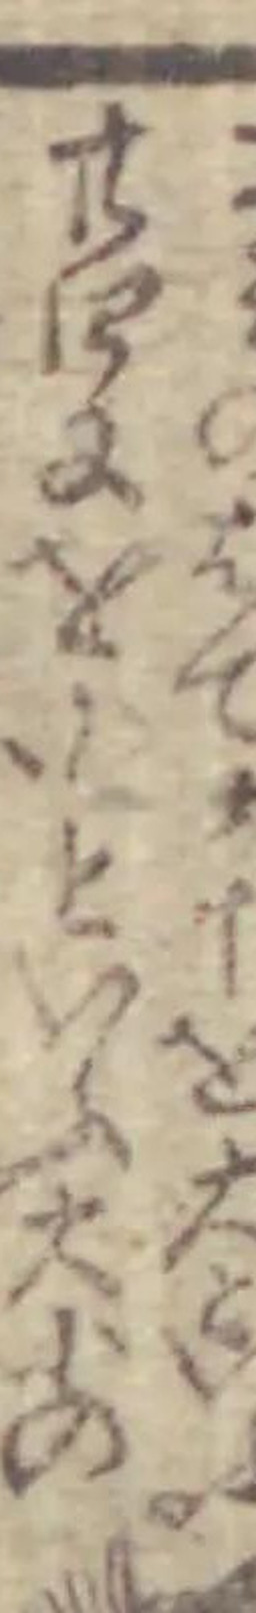廿四文を小といふ大小の
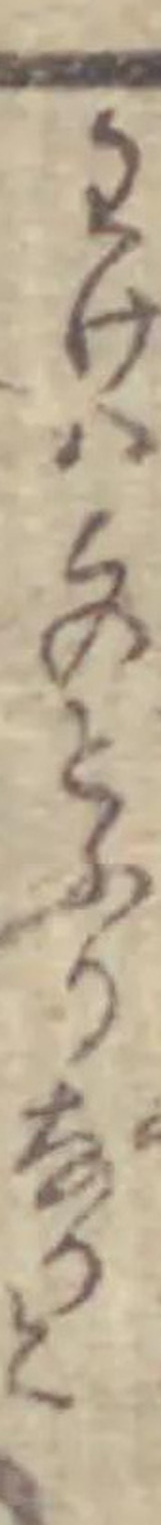わけはこのとふりなりと
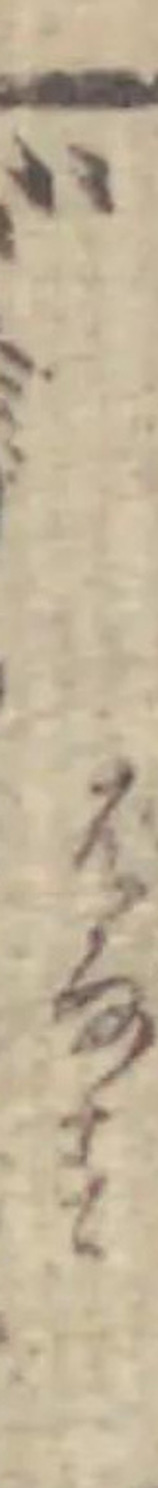はなす
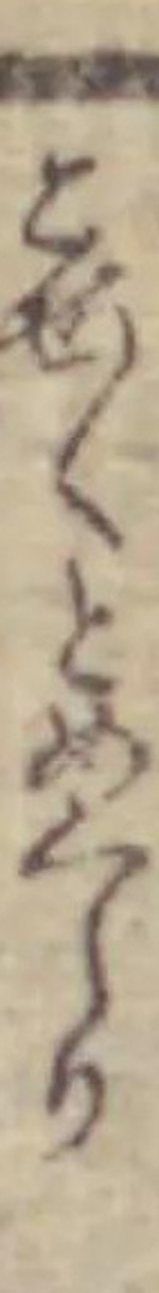こせ〳〵とめくしり
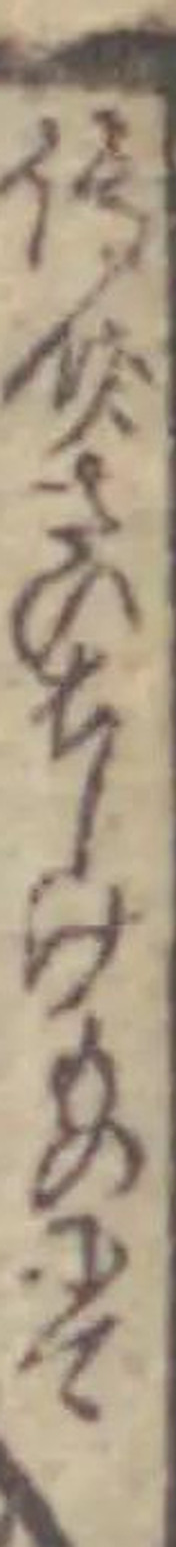伝介さいはしけものにて
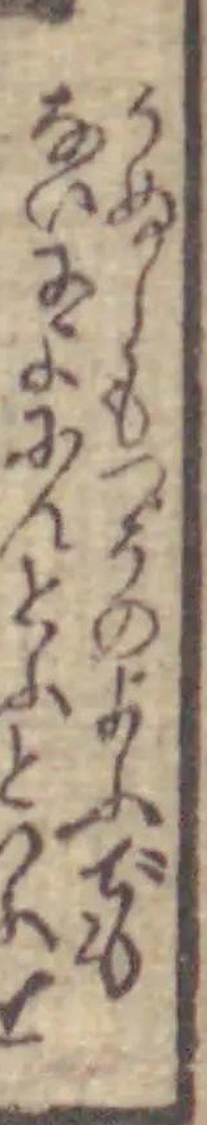ないによにんとふといふを
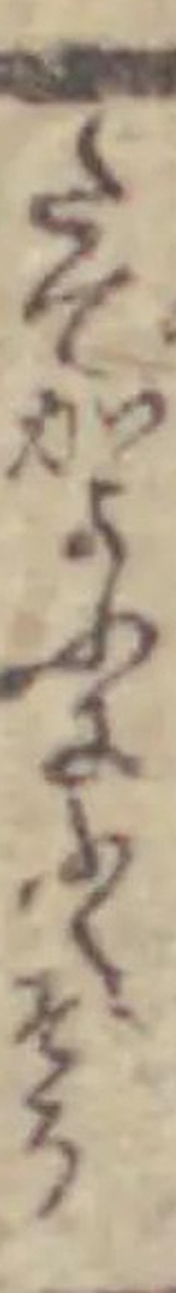たてかよふにふくそう
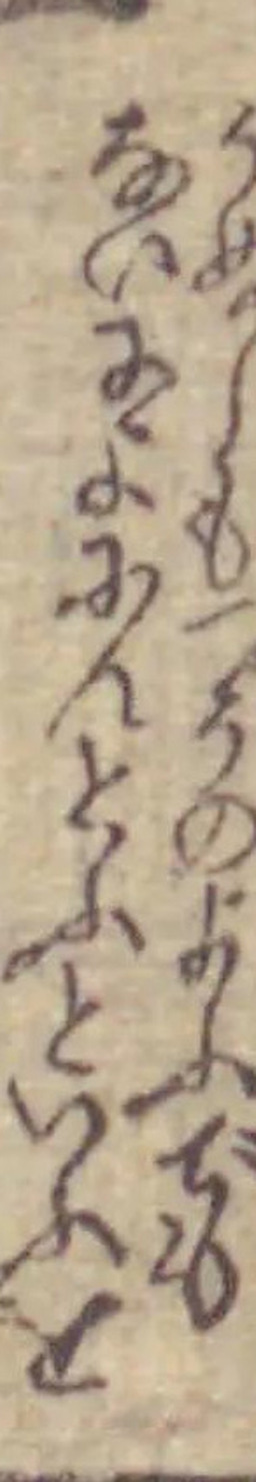ないによにんとふといふを
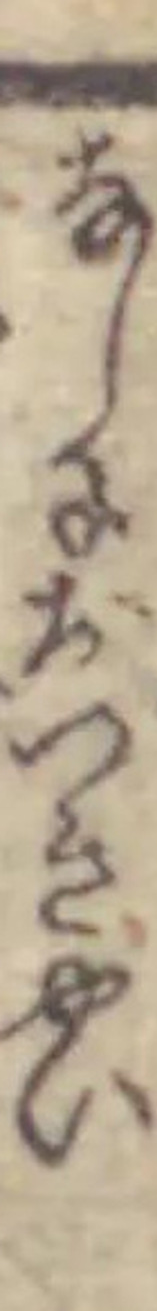なしにおつきやい
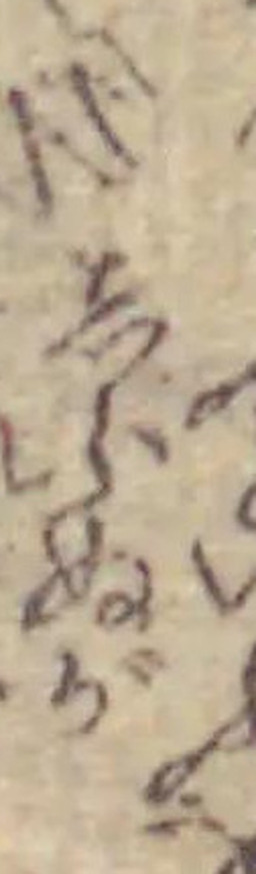しらぬが
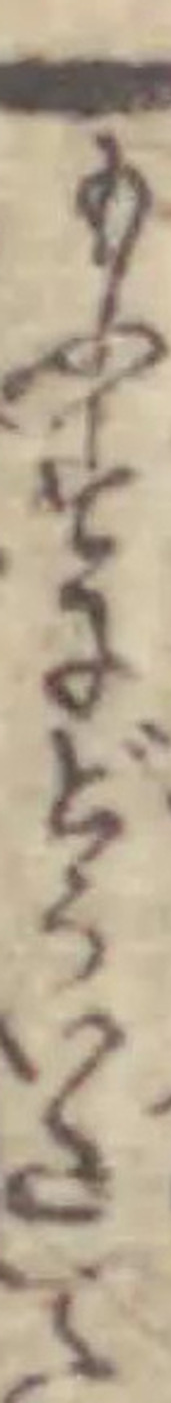もふすにどういたした
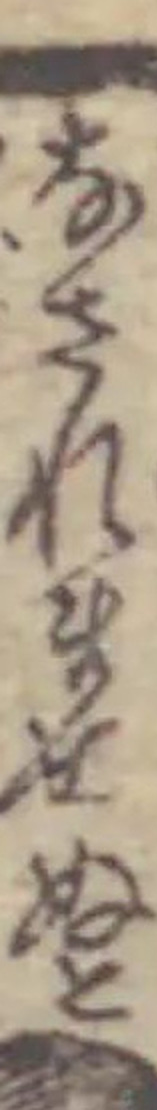なされませぬと
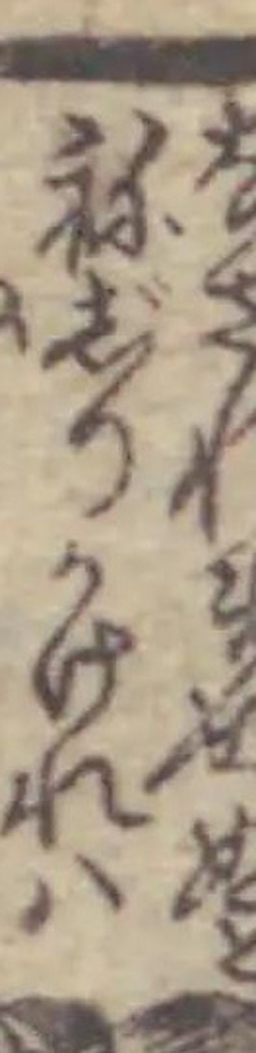ねじりかけれは
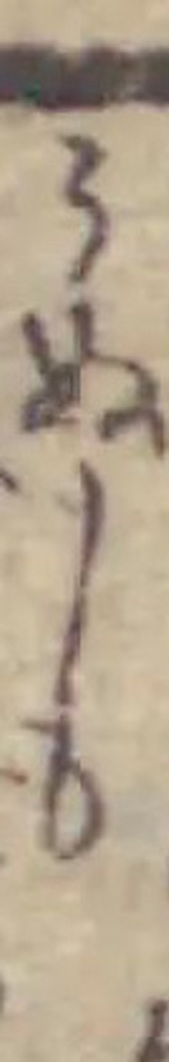うぬしも
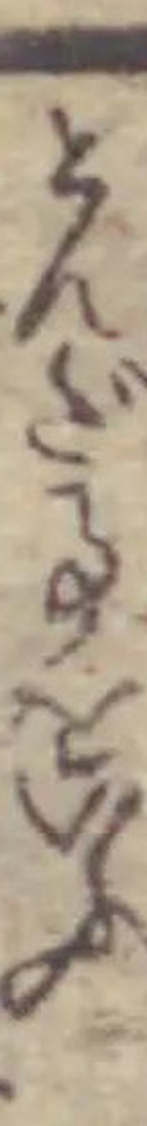とんだ事をいふ
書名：珍説女天狗 2巻
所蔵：国立国会図書館 National Diet Library, JAPAN
